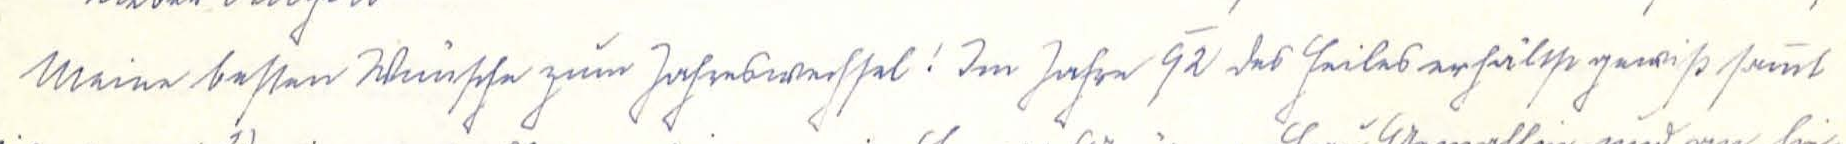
Meine besten Wünsche zum Jahreswechsel! Im Jahre 92 des Heiles erhältst gewiß saunt
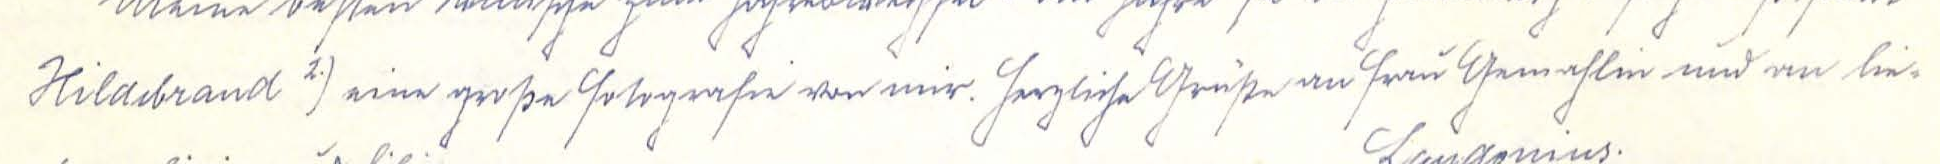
Hildebrand 2.) eine große Fotografie von mir. Herzliche Grüße an Frau Gemahlin und an lie-
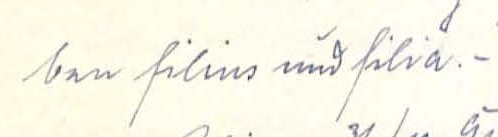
ben filius und filia.-
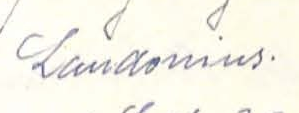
Laudonius
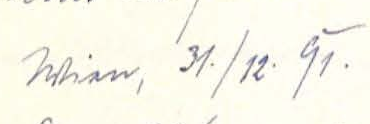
Wien, 31. /12. 91
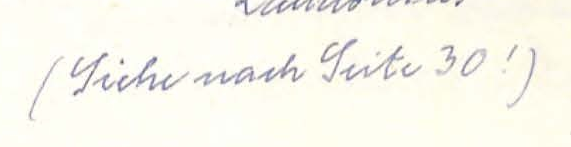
(Siehe nach Seite 30!)
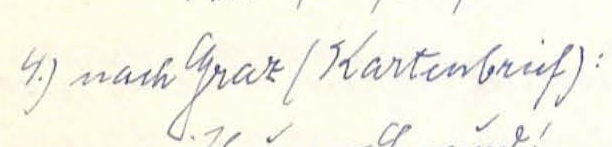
4. nach Graz (Kartenbrief):
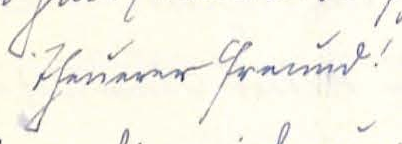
Theurer Freund!
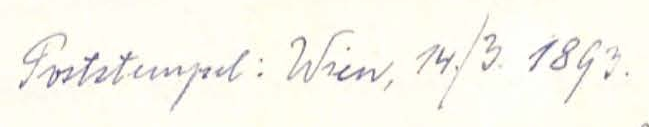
Poststempel: Wien, 14. / 3. 1893
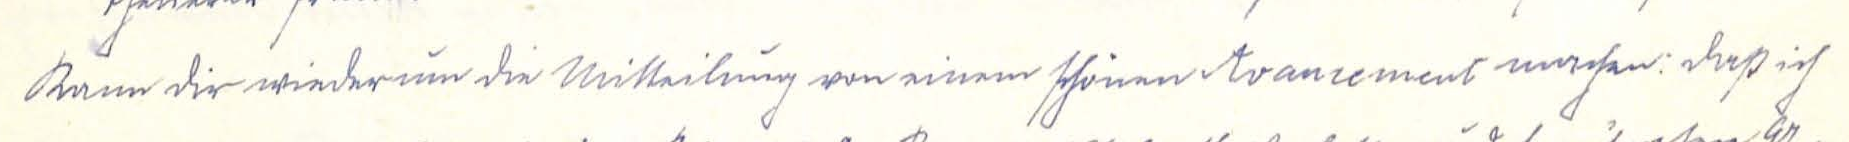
Kann dir wiederum die Mitteilung von einem schönen Avancement machen: Das ich
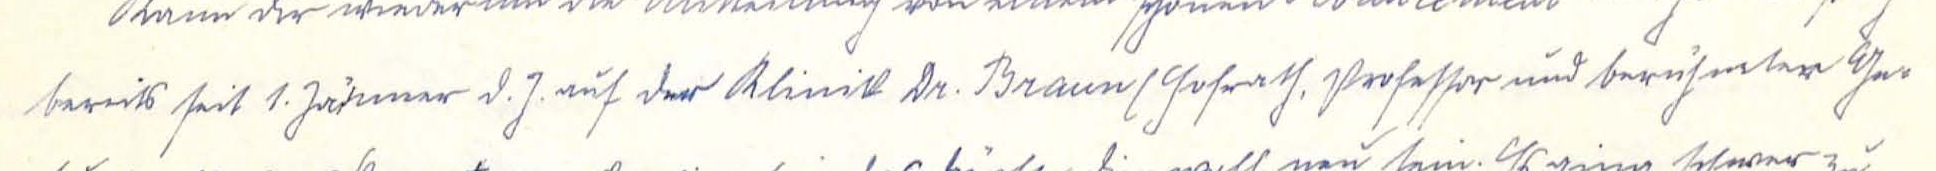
bereits seit 1. Jänner d. J. auf der Klinik Dr. Braun (Hofarzt, Professor und berühmter Ge-
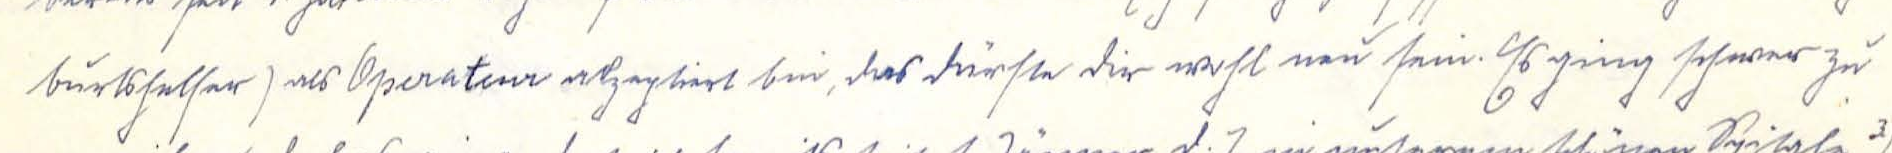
burtshelfer) als Operateur akzeptiert bin, das dürfte dir wohl neu sein. Es ging schwer zu
